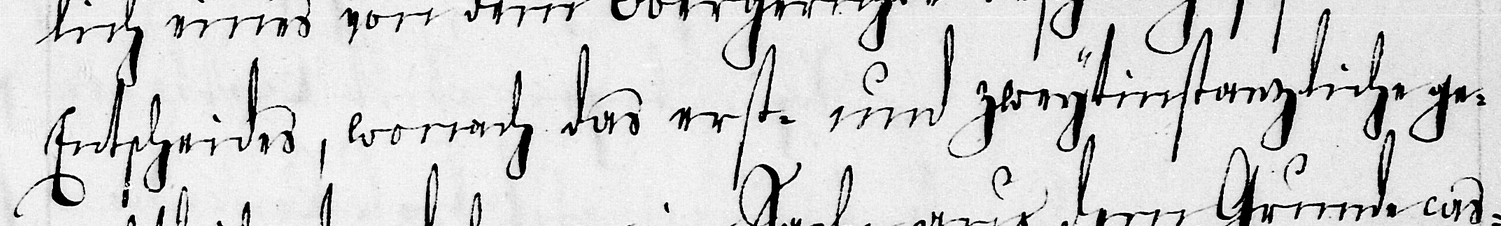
Entscheides, wonach das erst- und zweytinstanzliche ge¬
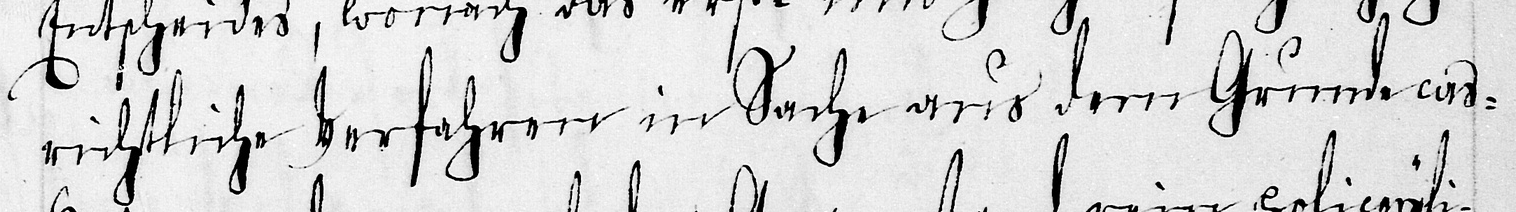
richtliche Verfahren in Sache aus dem Grunde cas¬
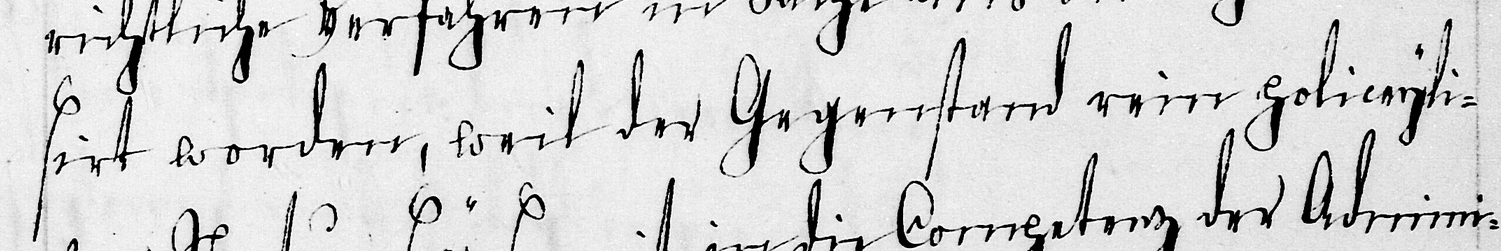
sirt worden, weil der Gegenstand rein policeyli¬
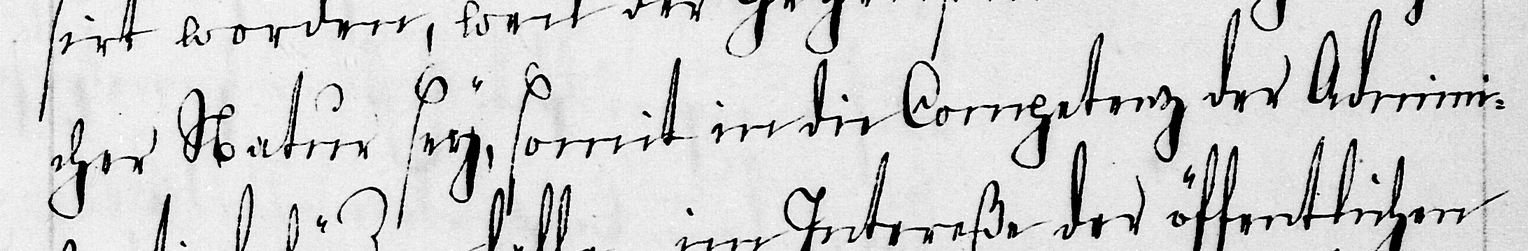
cher Natur sey, somit in die Competenz der Admini¬
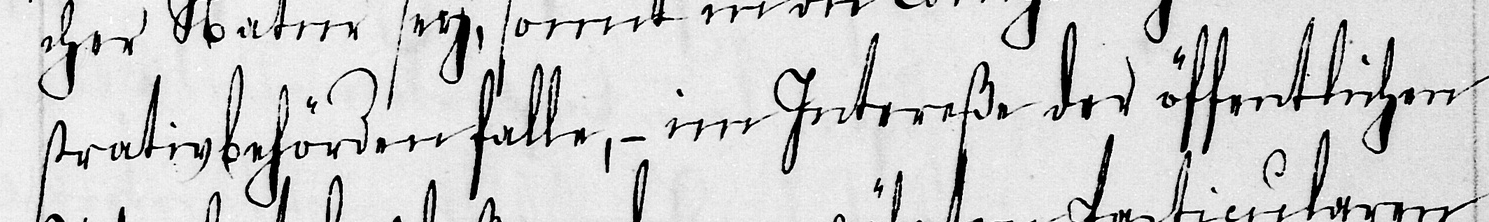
strativbehörden falle, – im Intereße der öffentlichen
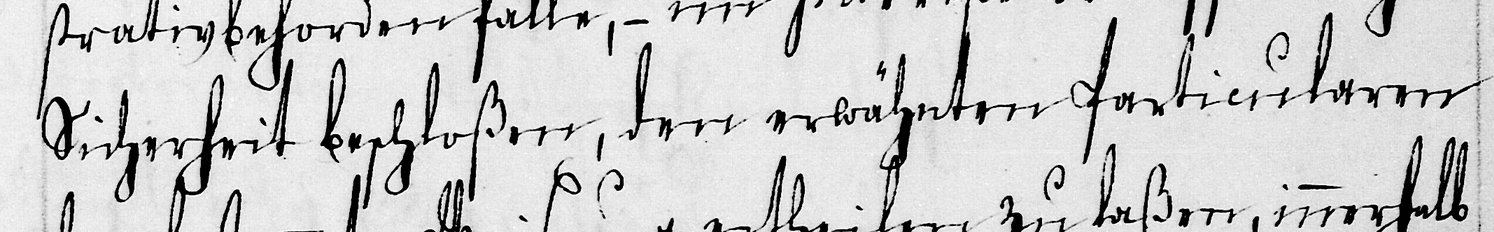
Sicherheit beschloßen, den erwähnten Particularen
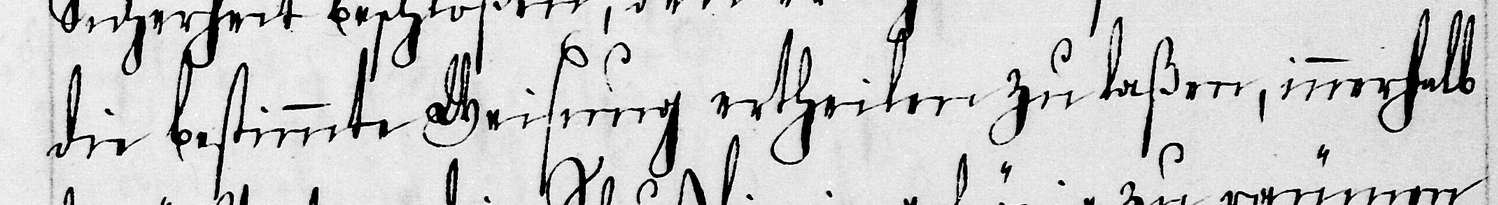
die bestimmte Weisung ertheilen zu laßen, innerhalb
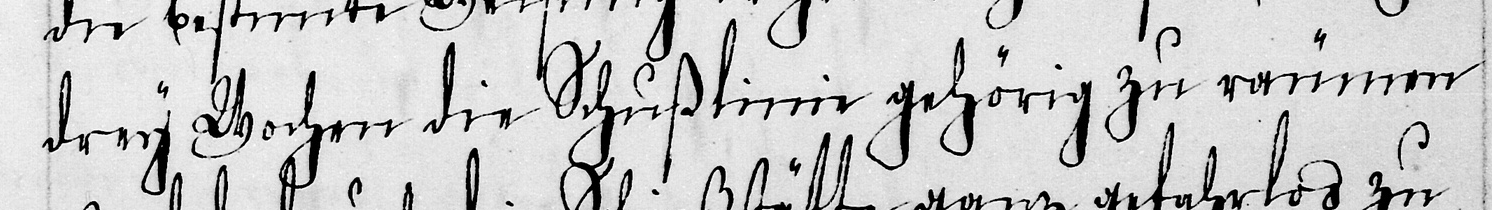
drey Wochen die Schußlinie gehörig zu räumen
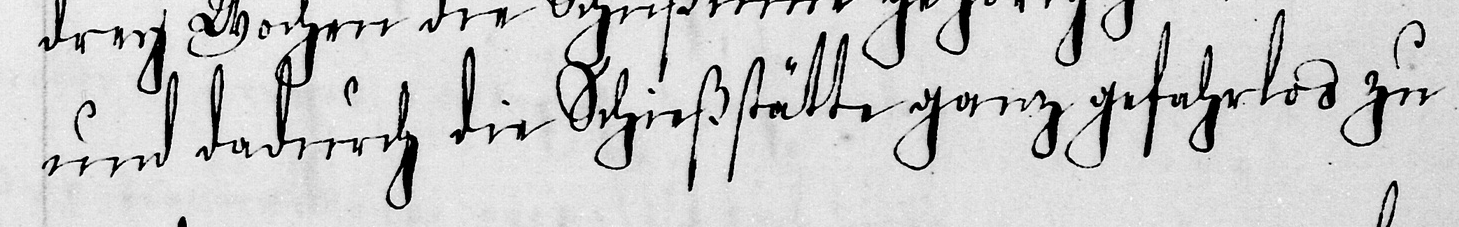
und dadurch die Schießstätte ganz gefahrlos zu
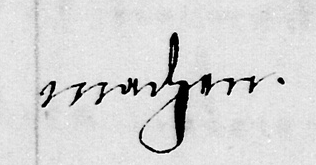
machen.
